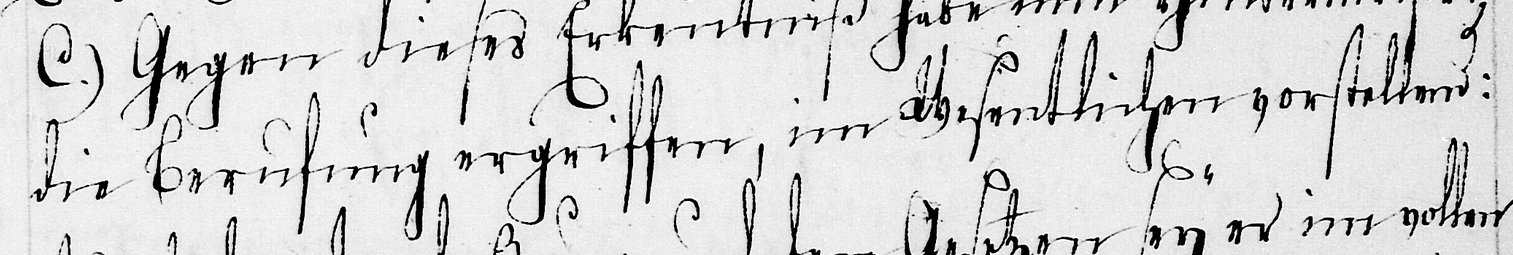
die Berufung ergriffen, im Wesentlichen vorstelle¬
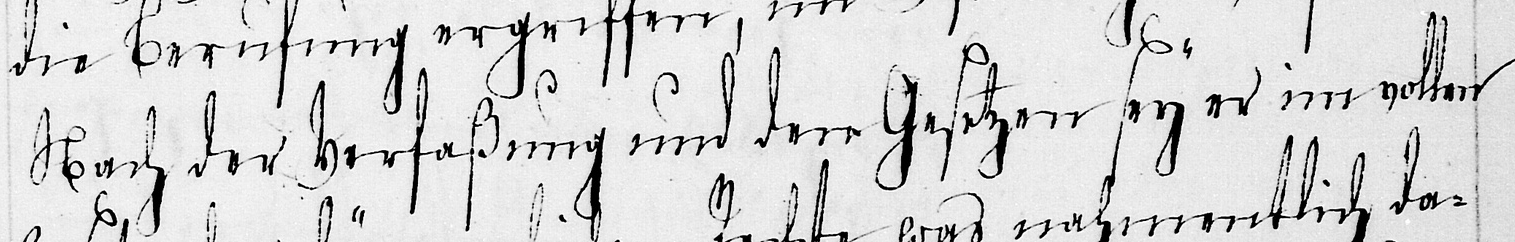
Nach der Verfaßung und den Gesetzen sey er im vollen
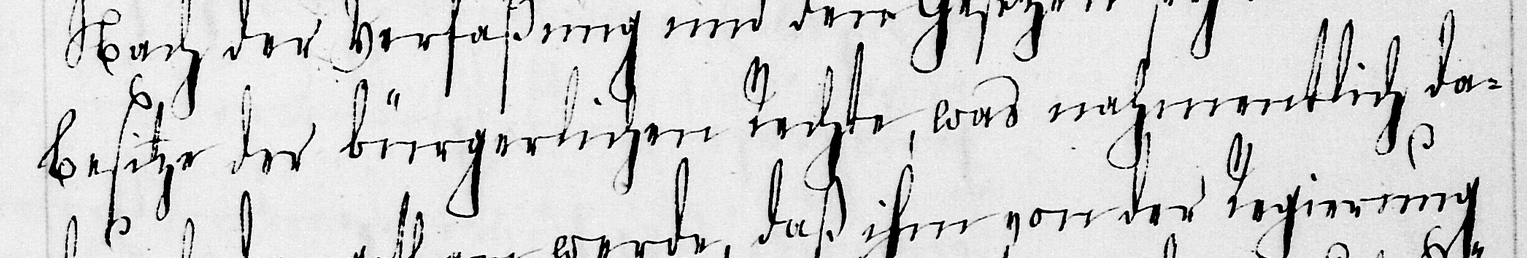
Besitze der bürgerlichen Rechte, was nahmentlich da¬
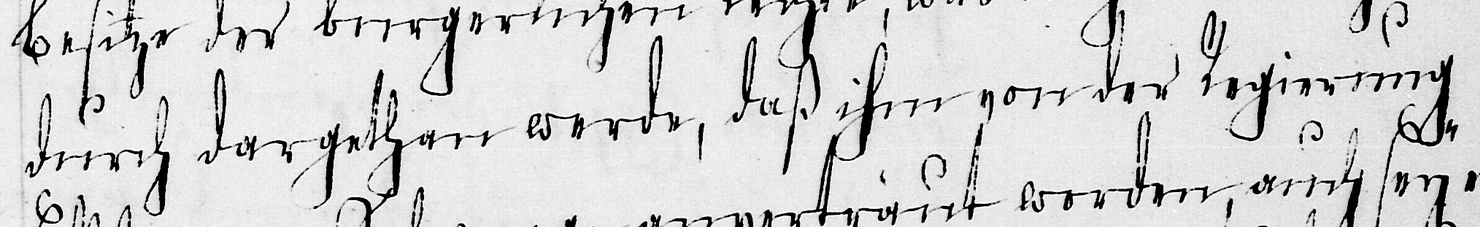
durch dargethan werde, daß ihm von der Regierung
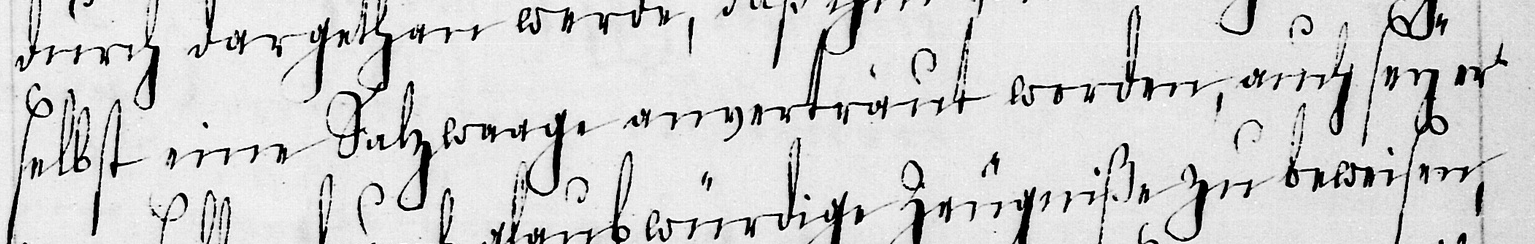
selbst eine Salzwaage anvertraut worden, auch sey er
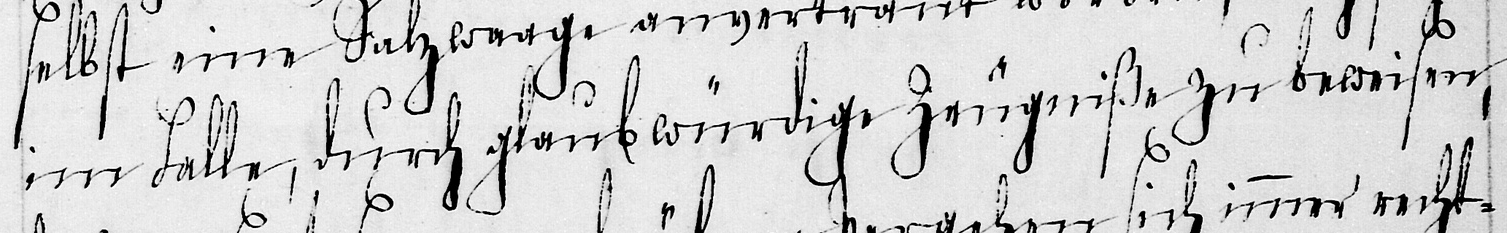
im Falle, durch glaubwürdige Zeugniße zu beweisen,
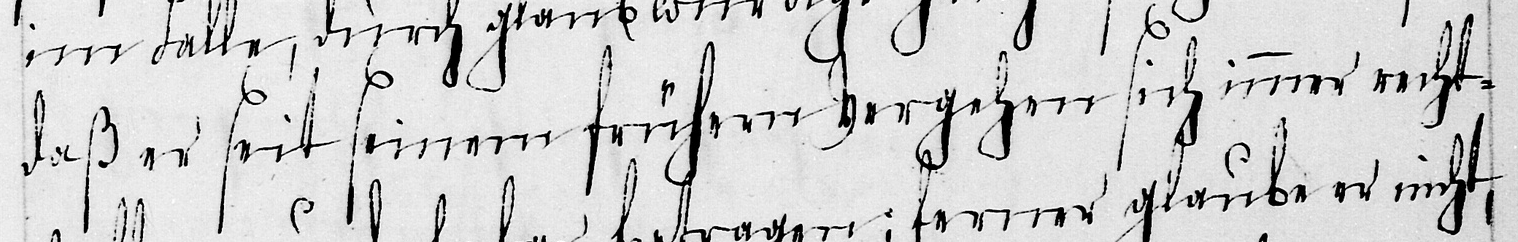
daß er seit seinem frühern Vergehen sich immer recht¬
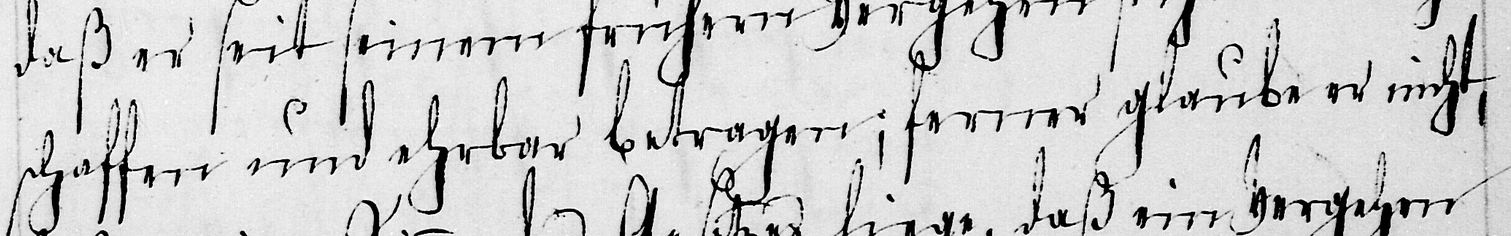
schaffen und ehrbar betragen; ferner glaube er nicht,
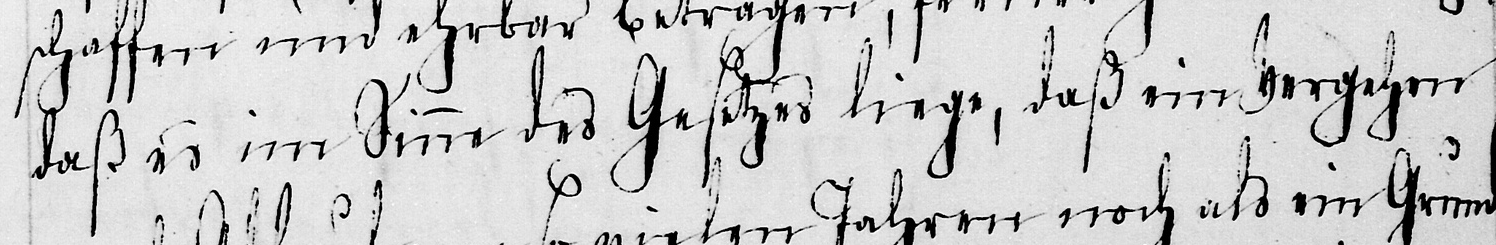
daß es im Sinne des Gesetzes liege, daß ein Vergehen
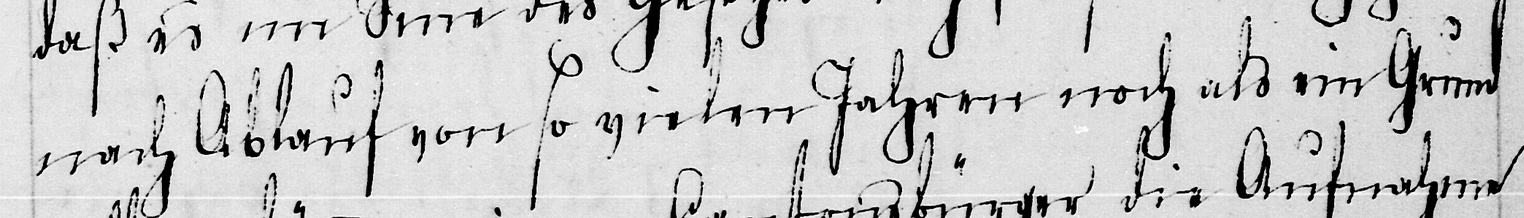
nach Ablauf von so vielen Jahren noch als ein Grund
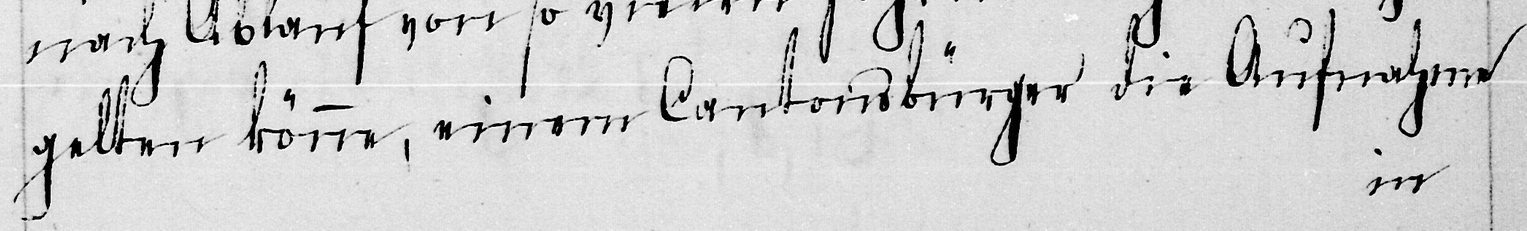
gelten könne, einem Cantonsbürger die Aufnahme
